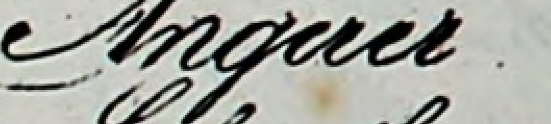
Angerer
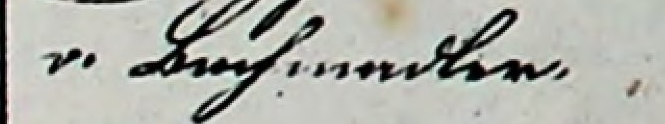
v. Bachmadler
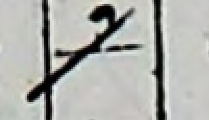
7
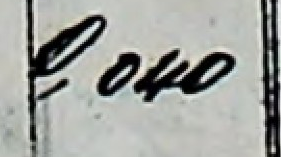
0,040
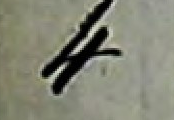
4
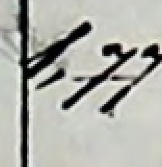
1,77
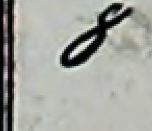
8
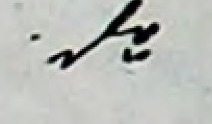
do
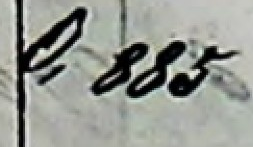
0,885
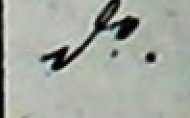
do
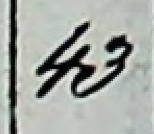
43
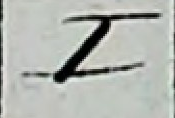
I
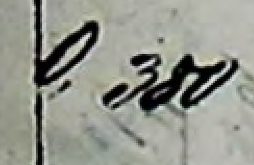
0,380
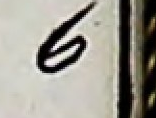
6
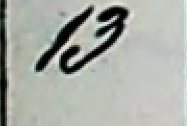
13
